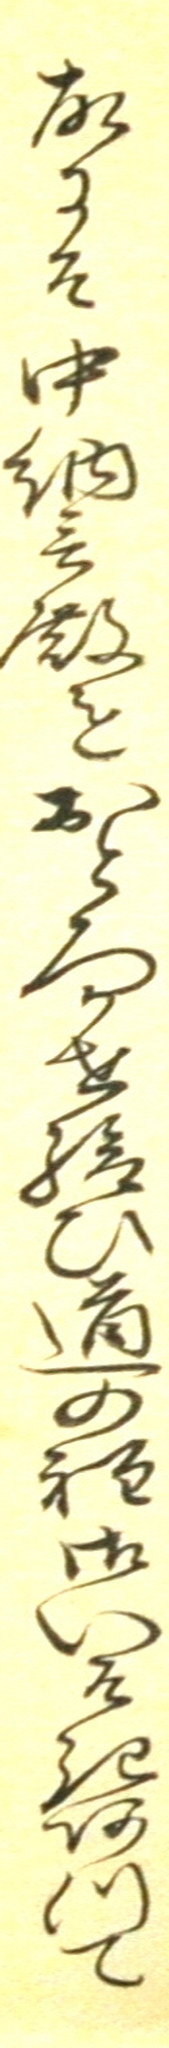故にそ中納言殿もおとろかせ給ひ道の程御いそきあつて
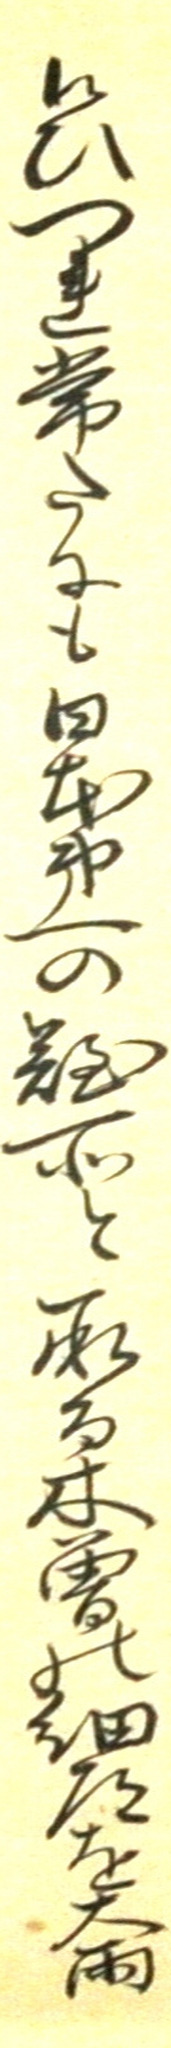候ひつれ常たにも日本第一の難所と承る木曽の細道を大雨
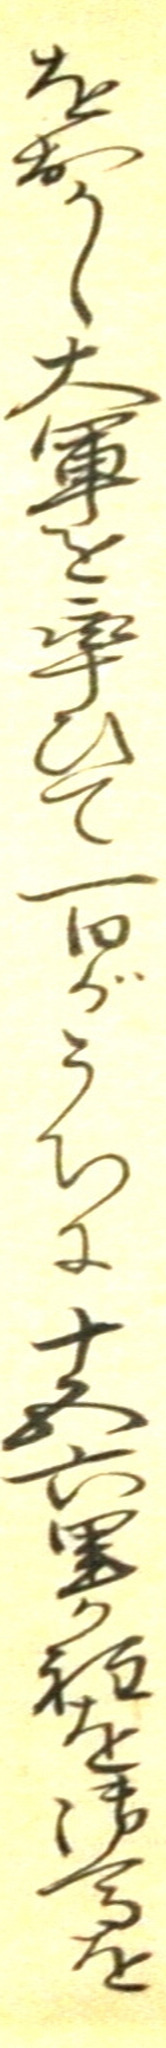をおかし大軍を率ひて一日がうちに十五六里か程を御馬を
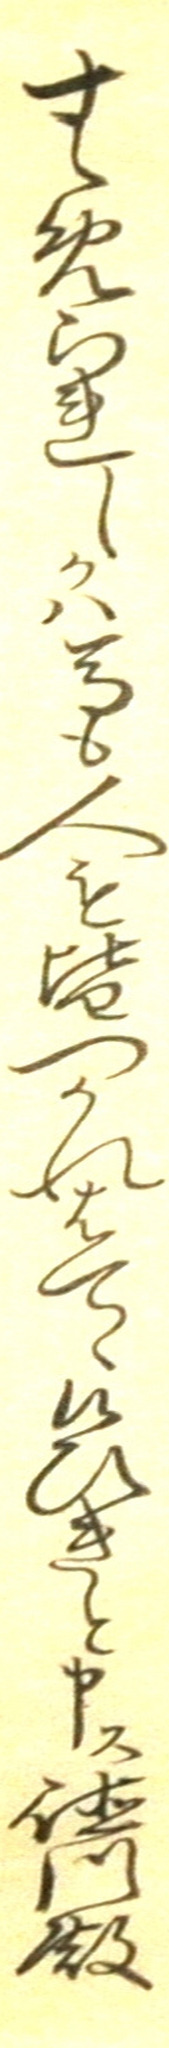すゝめられしかは馬も人もつかれはてゝ候ひきと申ス徳川殿
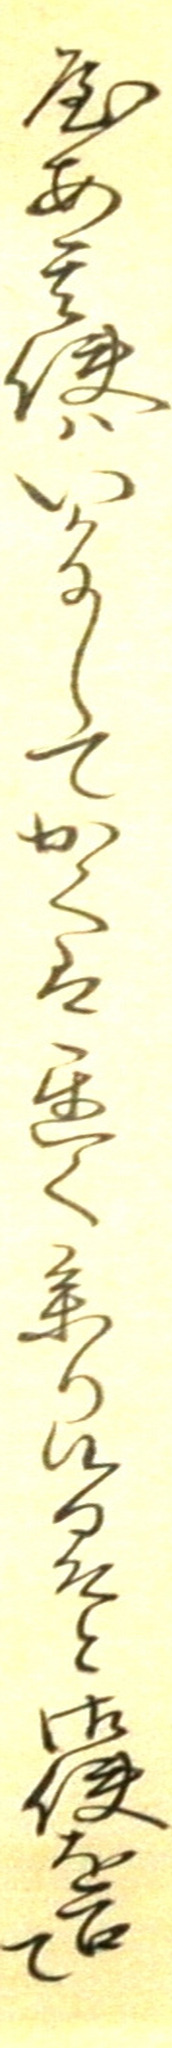やあ其使はいかにしてかくは遅く参りけるそと御使を召て
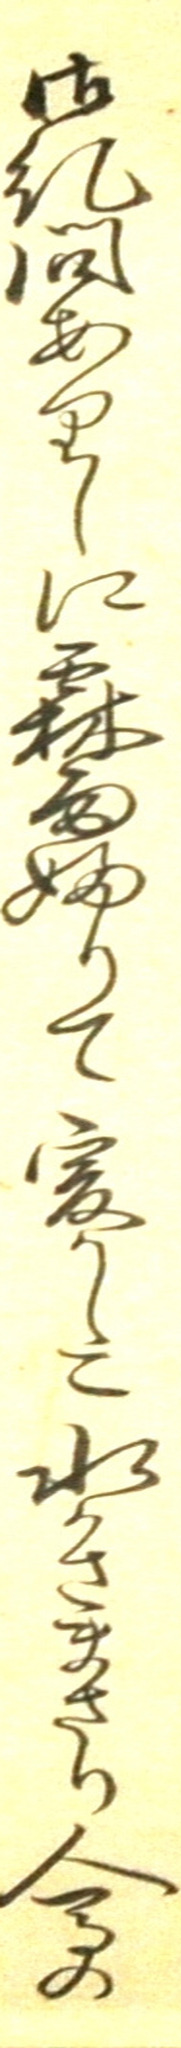御糺問ありしに霖雨ふりて爰かしこ水かさまさり人馬の
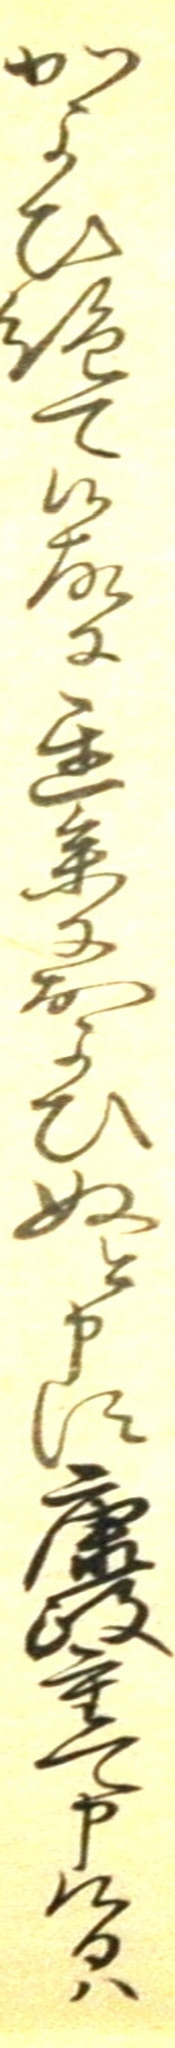かよひ絶て候故に遅参におよひぬと申候康政重て申けるは
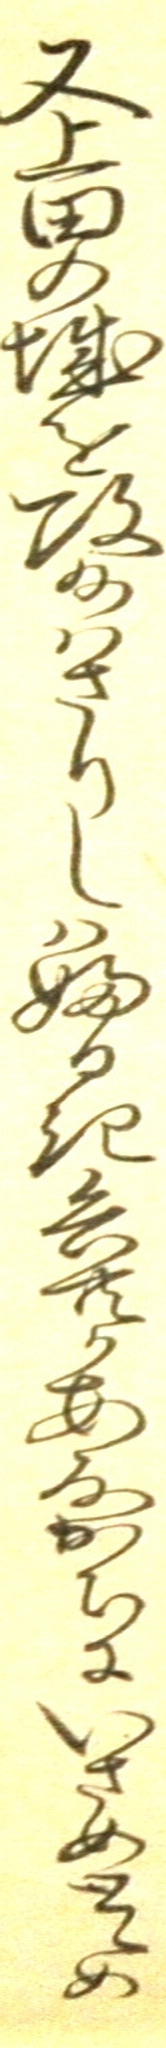又上田の城を攻給はさりしはふるき兵共かあなかちにいさめとゝめ
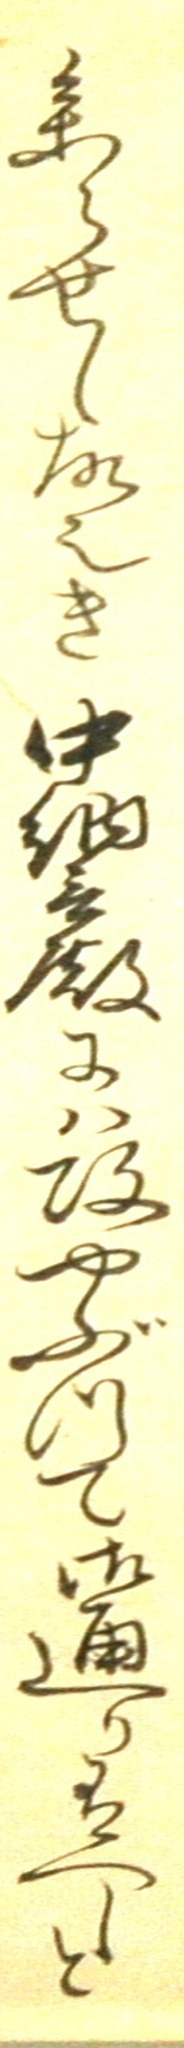参らせし故也き中納言殿には攻やぶつて御通り有へしと
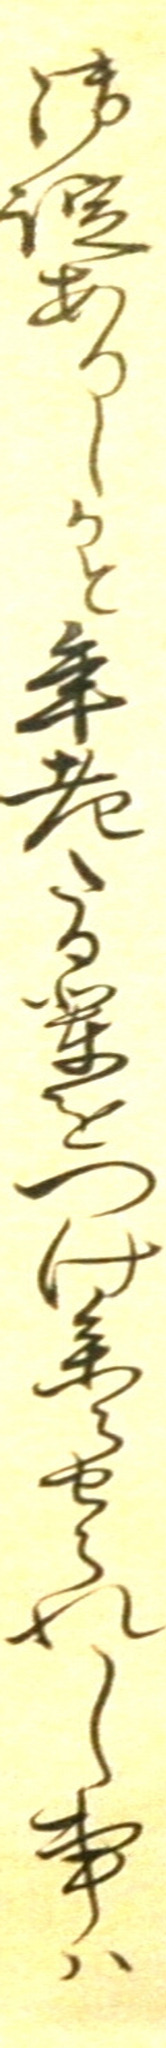御諚ありしかと年老たる輩をつけ参らせられし事は
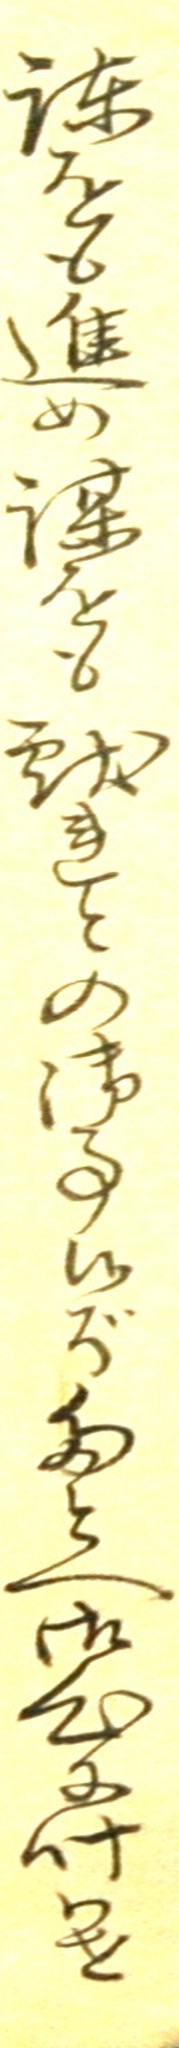陣をも進め謀をも献れとの御事候ぞたとへ御心に叶わせ

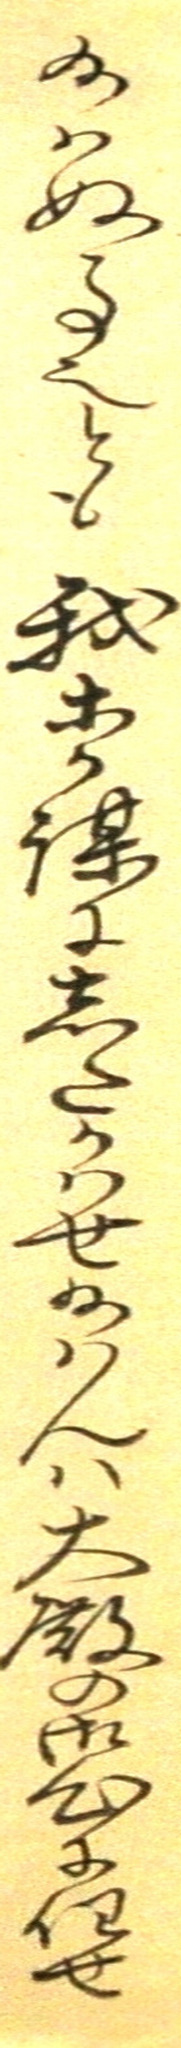給はぬ事也とも我等か謀にしたかはせ給はんは大殿の御心に任せ
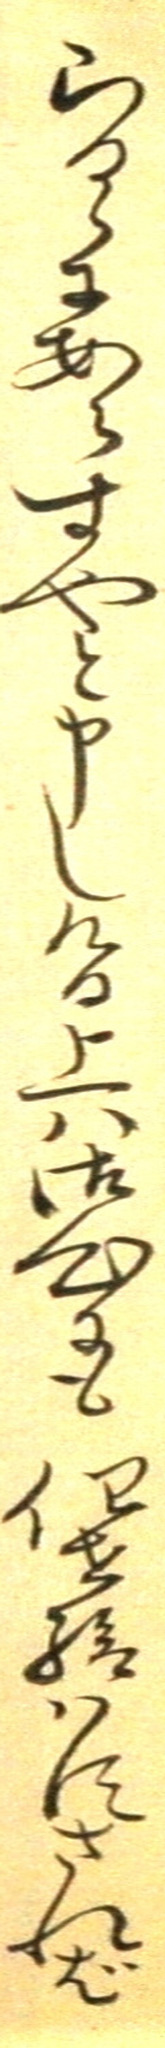らるゝにあらすやと申しける上は御心にも任せ給はすされば
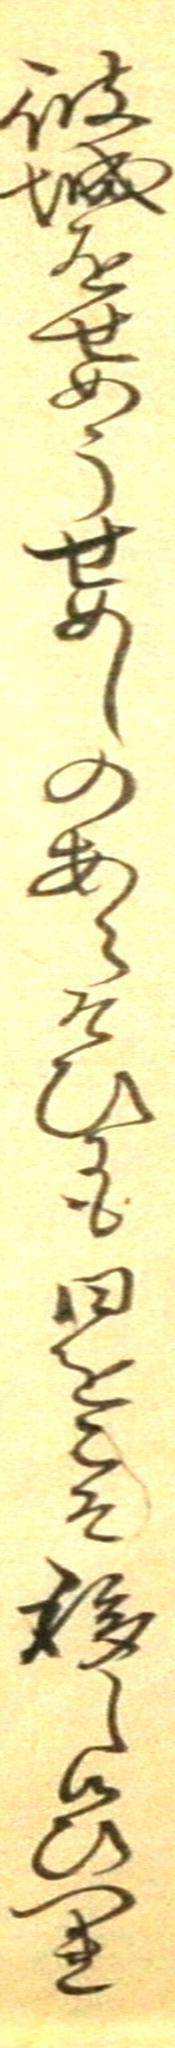彼城をせめうせめしのあらそひにも日をこそ移し候ひつれ
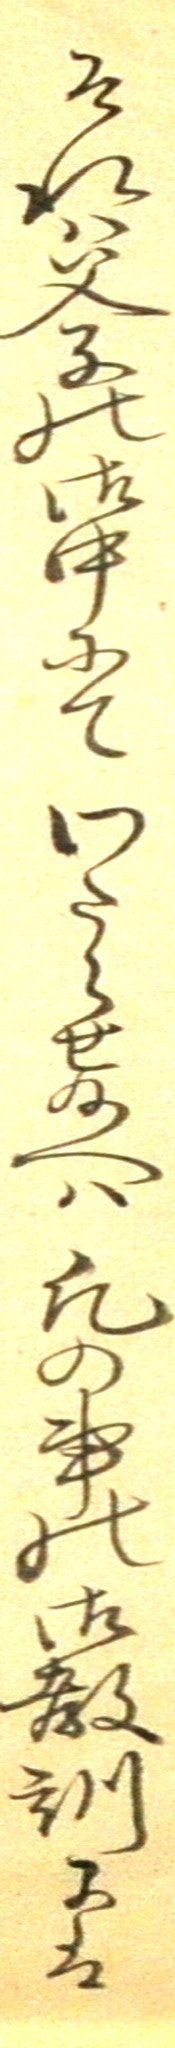それは父子の御中にてわたらせ給へは凡の事の御教訓には
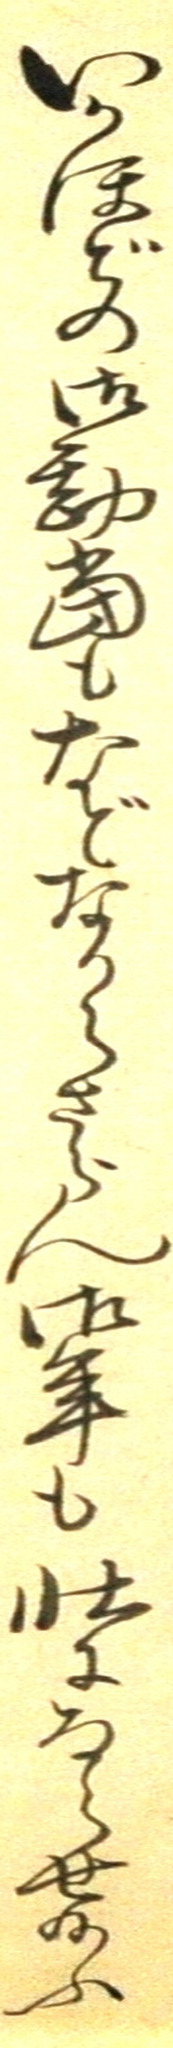いかほどの御勘当もなどなからさらん御年も壮にならせ給ふ
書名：藩翰譜（四・上）
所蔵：伊那市立高遠町図書館・合同会社AMANE
